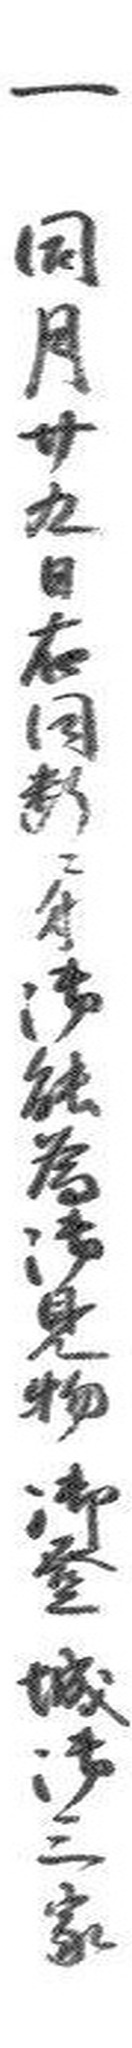一同月廿九日右同断ニ付御能為御見物御登城御三家
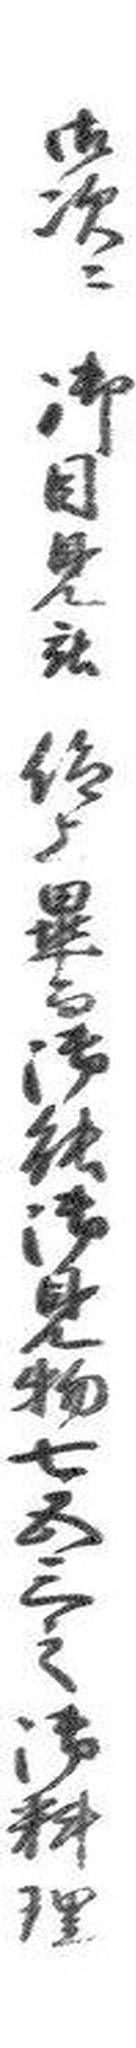御次ニ御目見被仰上畢而御能御見物七五三之御料理
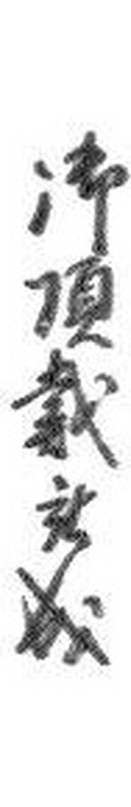御頂戴被成
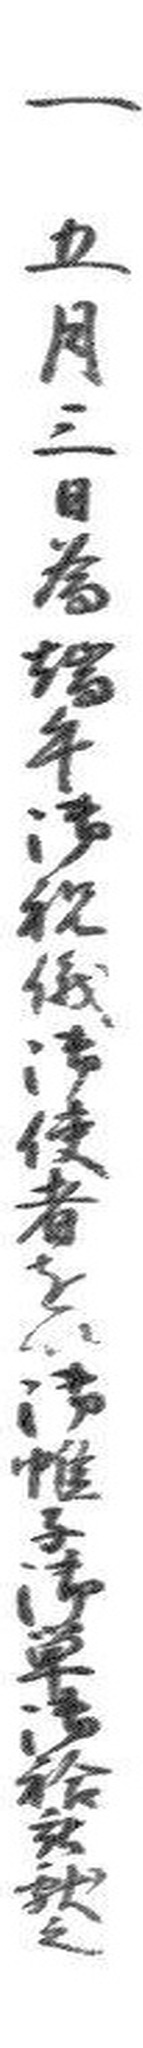一五月三日為端午御祝儀御使者を以御帷子御単御袷被献之
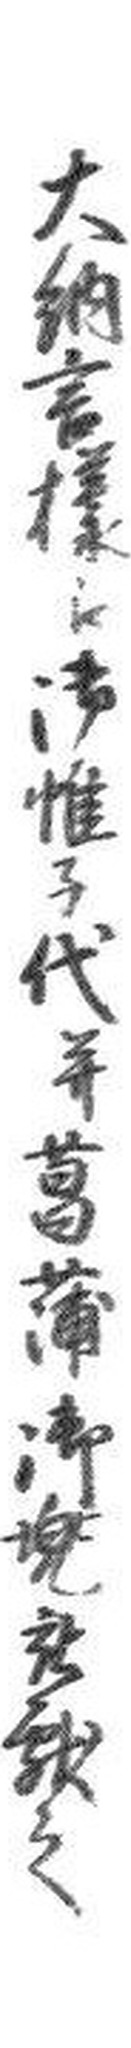一大納言様江御帷子代并菖蒲御兜被献之
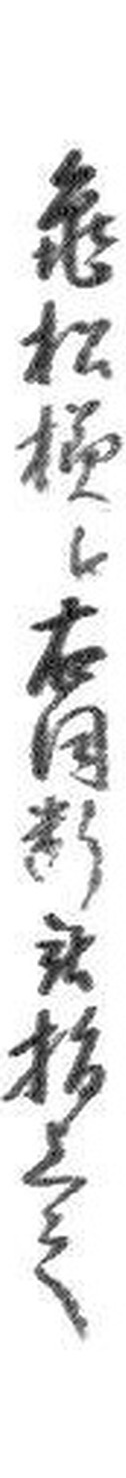亀松様江右同断被指上之
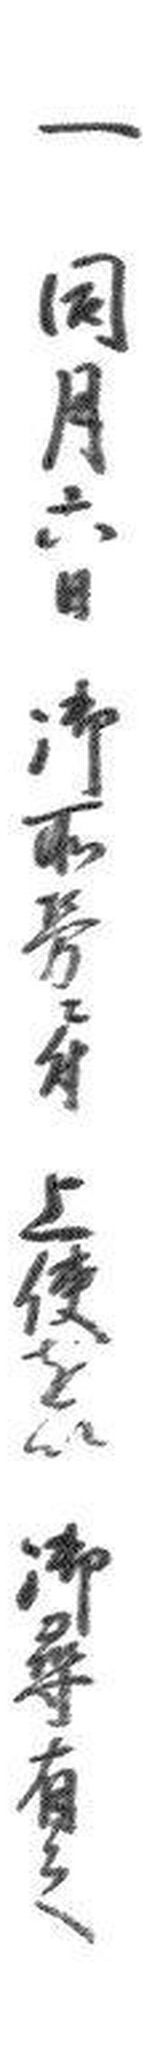一同月六日御所労ニ付上使を以御尋有之
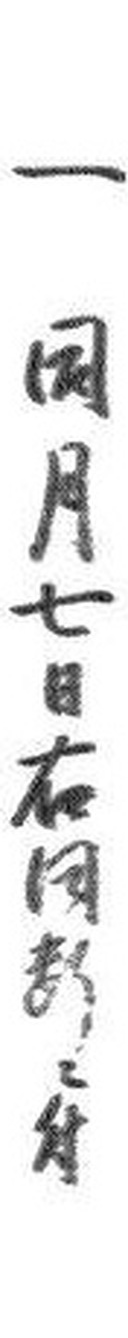一同月七日右同断ニ付
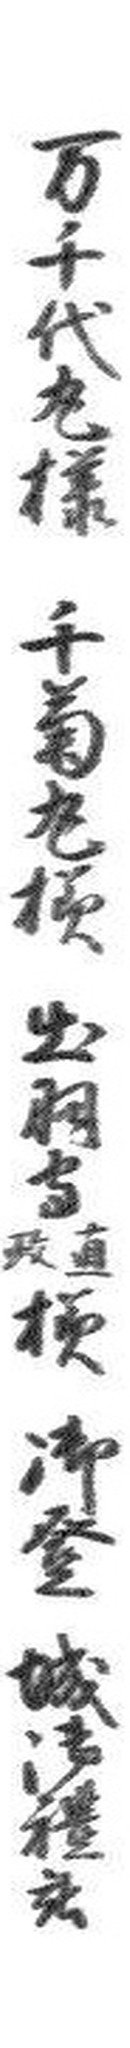万千代丸様千菊丸様出羽守直政様御登城御礼被
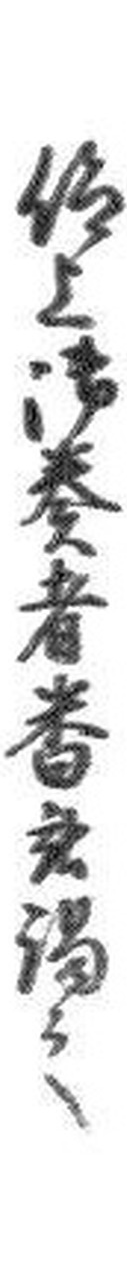仰上御奏者番被謁之

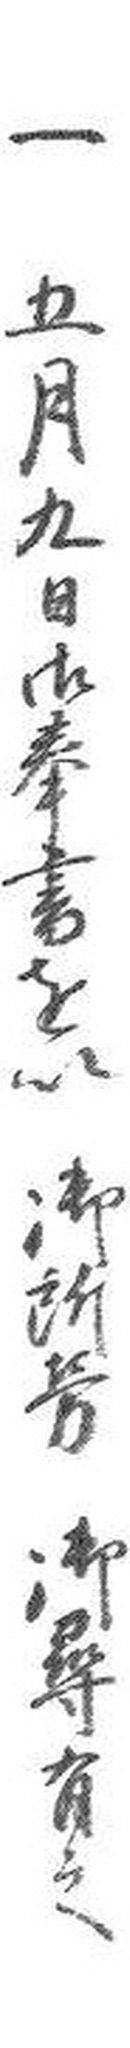一五月九日御奉書を以御所労御尋有之
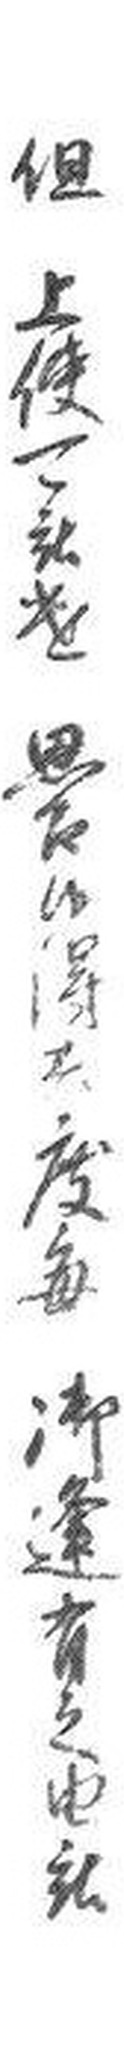但上使可被遣思召候得共度毎御逢有之由被
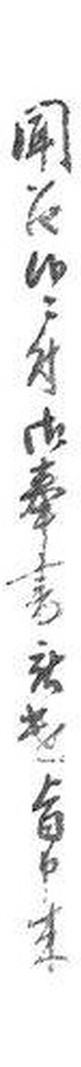聞召候ニ付御奉書被遣旨申来
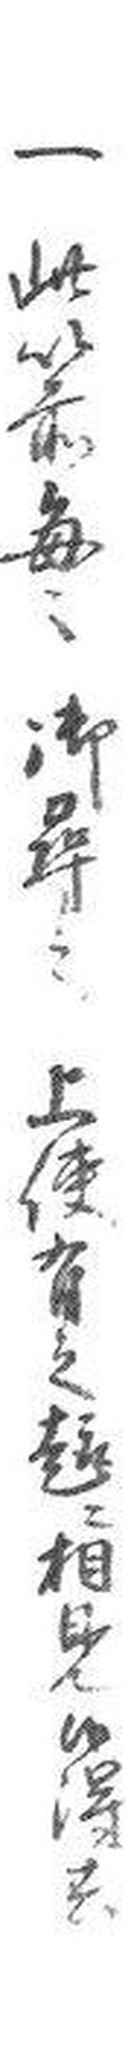一此以前毎々御尋之上使有之趣ニ相見候得共
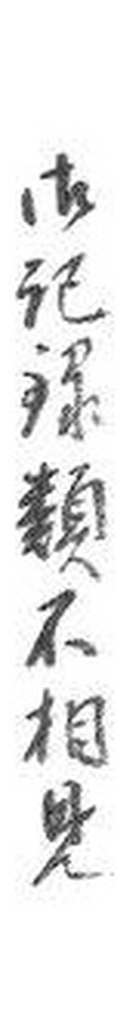御記録類不相見
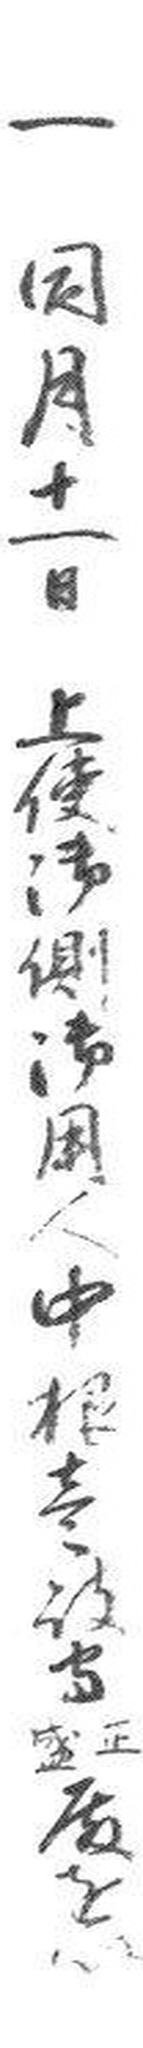一同月十一日上使御側御用人中根壱岐守正盛殿を以
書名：家譜 四 忠昌公 従寛永七年到正保四年
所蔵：福井県文書館 Fukui Prefectural Archives
